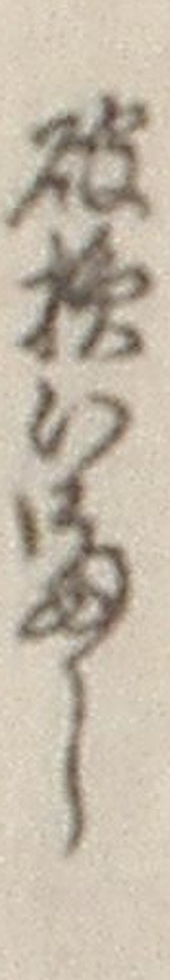破損いたし
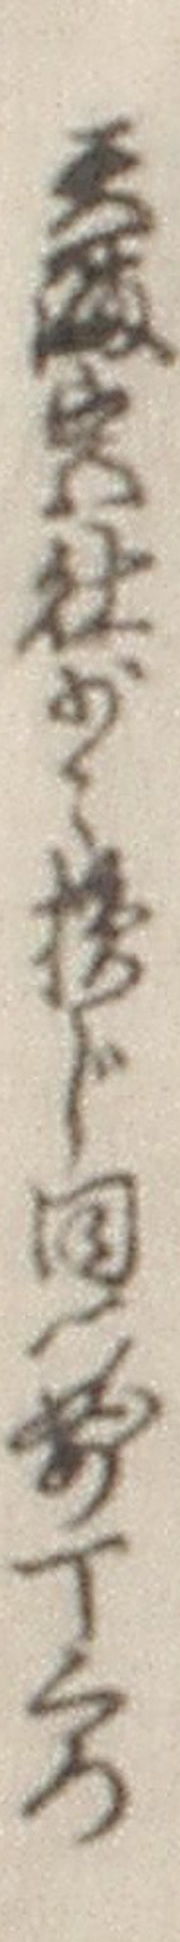天満宮社少〻損じ同門前丁くろ
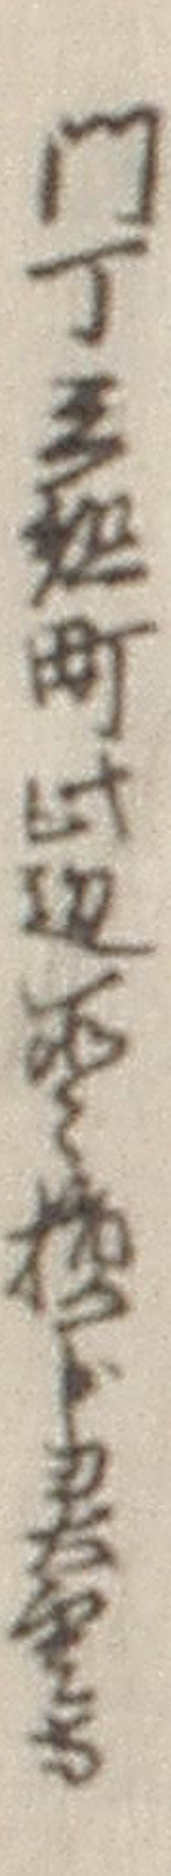門丁三組町此辺所〻損申旻重寺
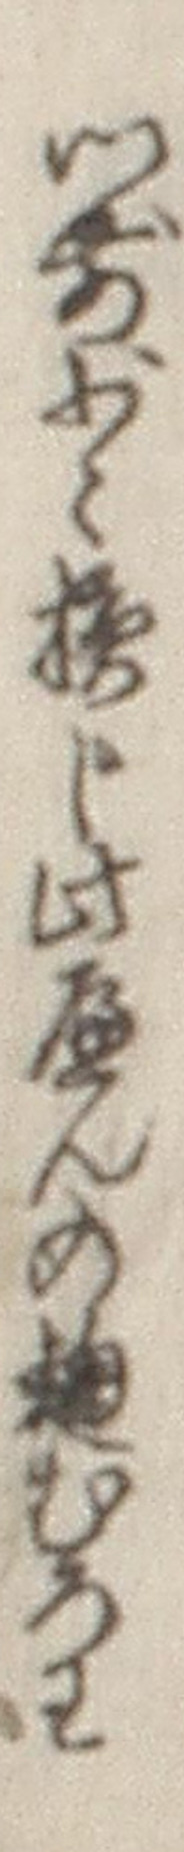門前少〻損じ此遍んの麹むろわ
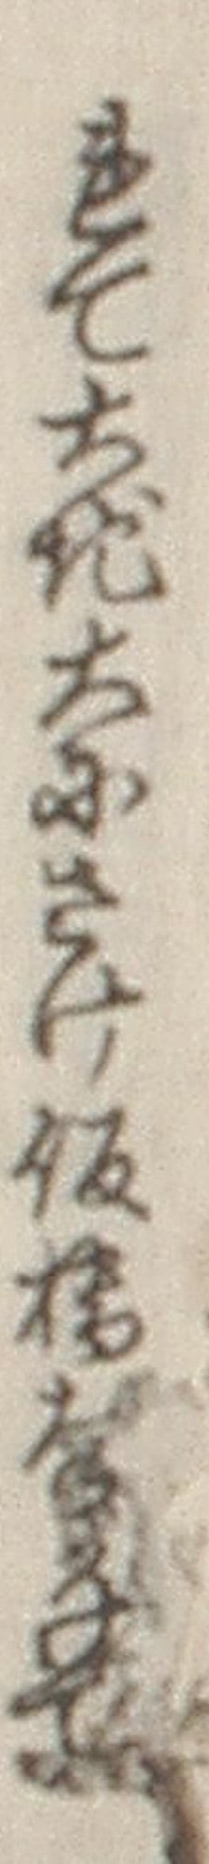れて大地大にさけ板橋懸子て
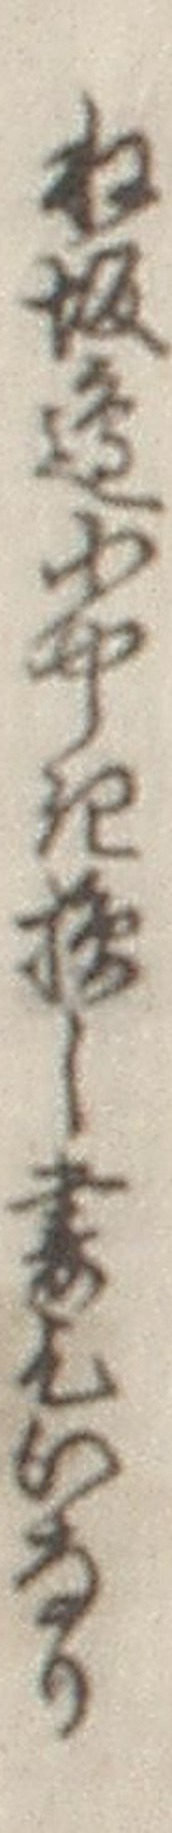ね坂邊小やき損し妻乞いなり
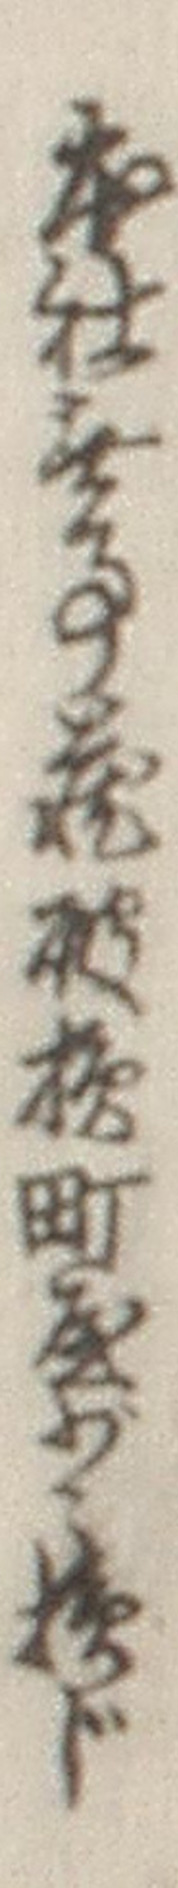本社無事蔵破損町屋少〻損じ
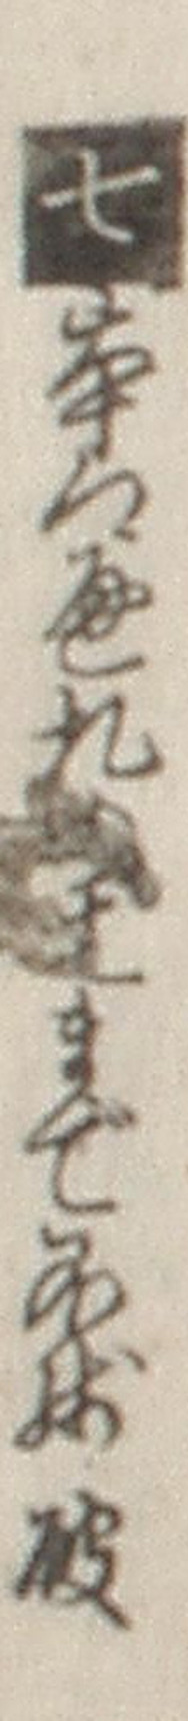七本郷遍札の辻まで不残破
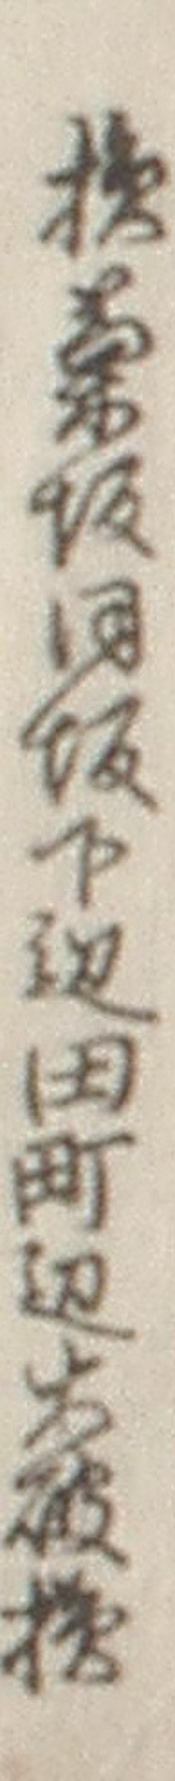損栄坂同坂下辺田町辺大破損
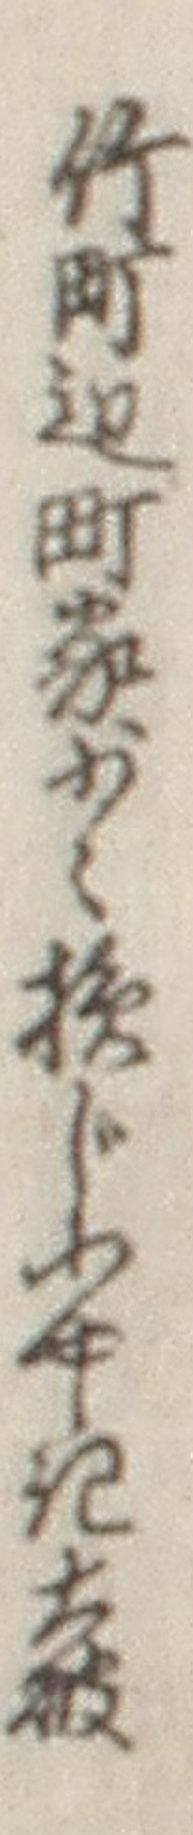竹町辺町家少〻損じ小やしき大破
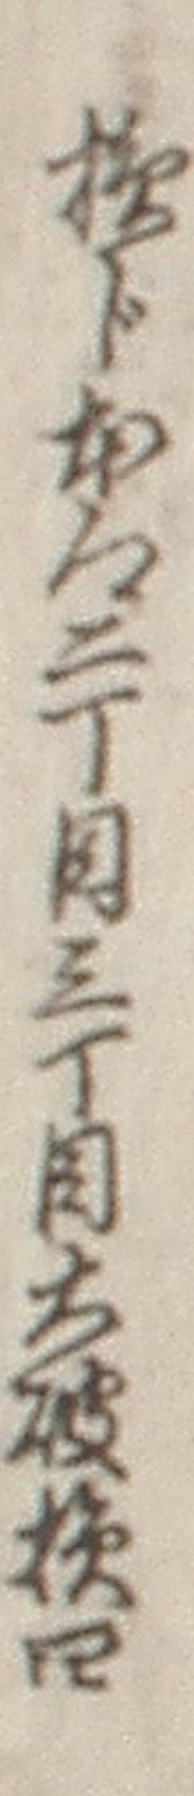損じ本郷二丁目三丁目大破損四
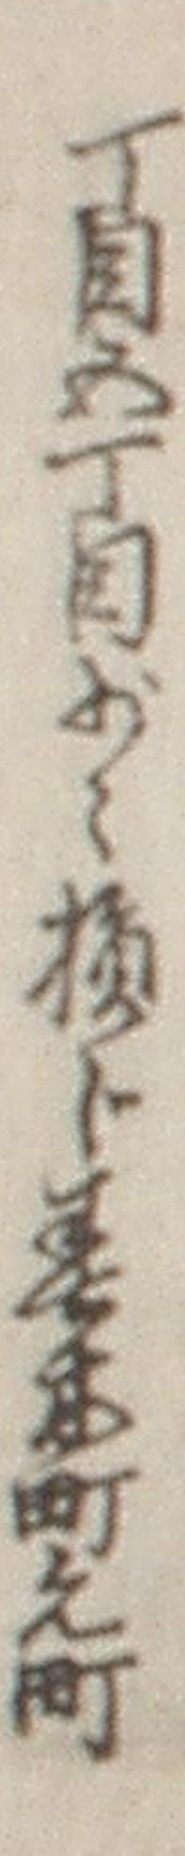丁目五丁目少〻損じ春木町元町
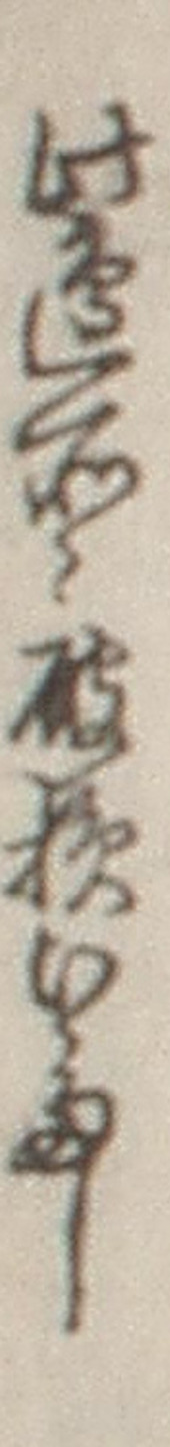此邊所〻破損いたし

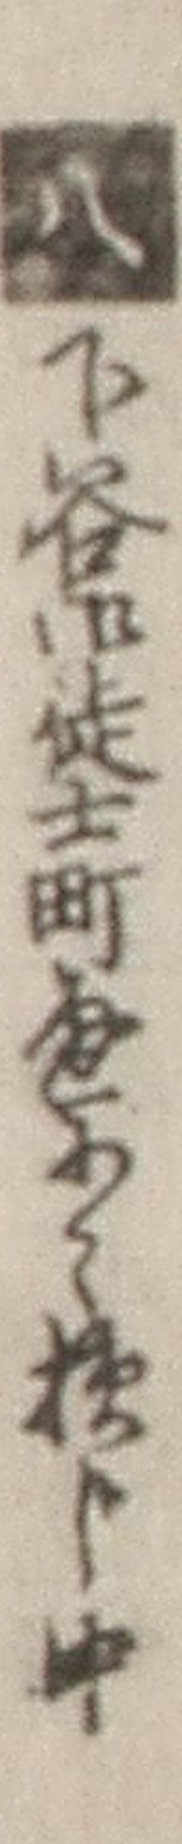八下谷御徒士町遍少〻損じ中
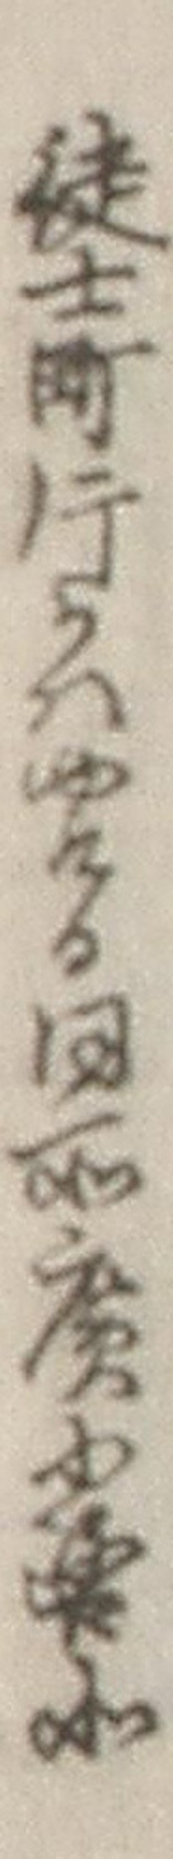徒士町片かはやける同所廣小築北
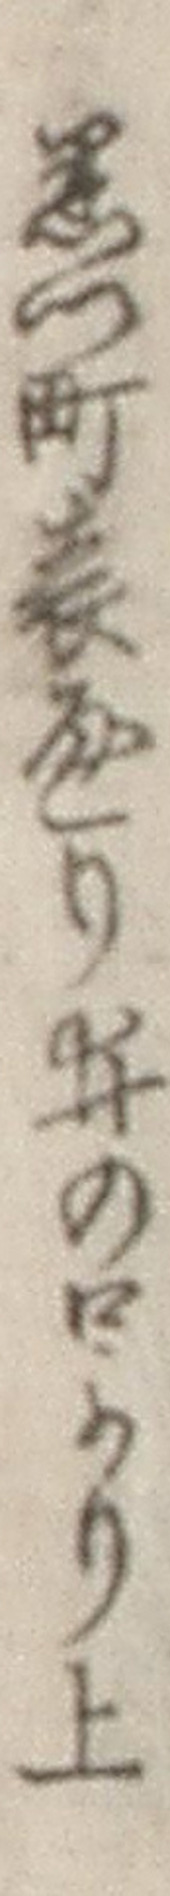黒門町表通り井の口より上
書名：江戸　大地震臣細録　全
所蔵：東京大学地震研究所図書室 Earthquake Research Institute Library, The University of Tokyo, JAPAN
